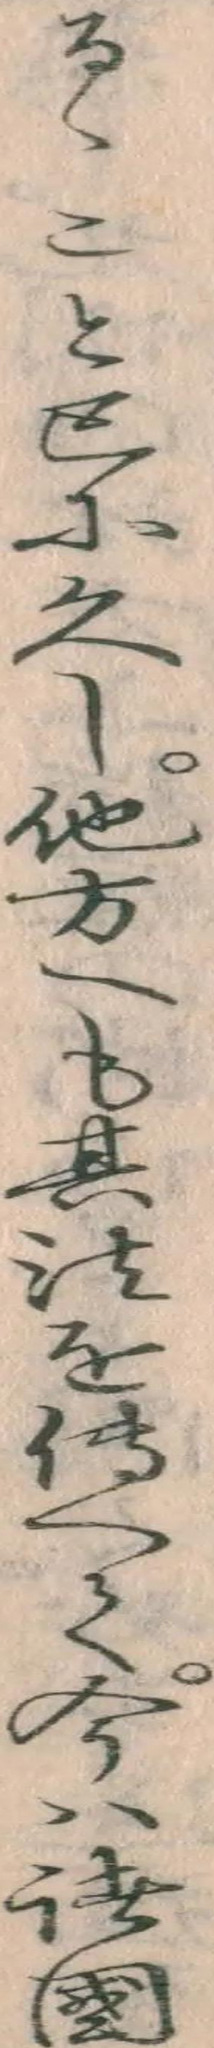るゝこと已に久し。他方へも其法を伝へて。今は諸国
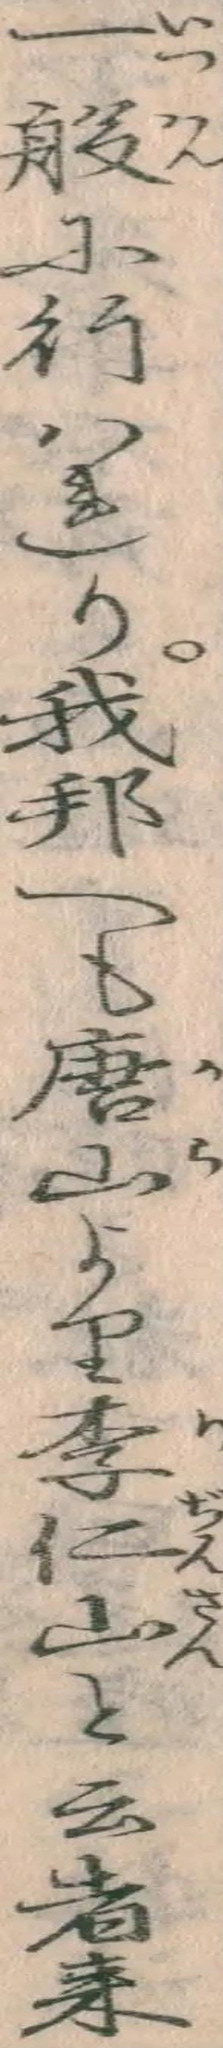一般に行はれり。我邦へも唐山より李仁山と云者来
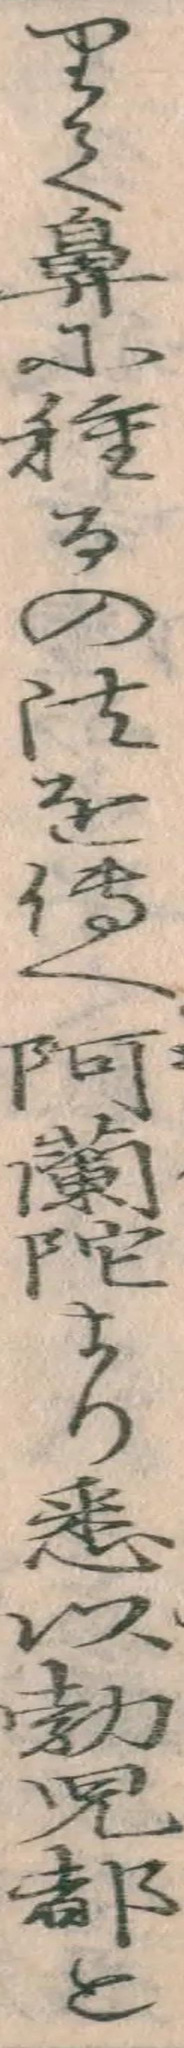りて鼻に種るの法を伝へ。阿蘭陀より悉以勃児都と
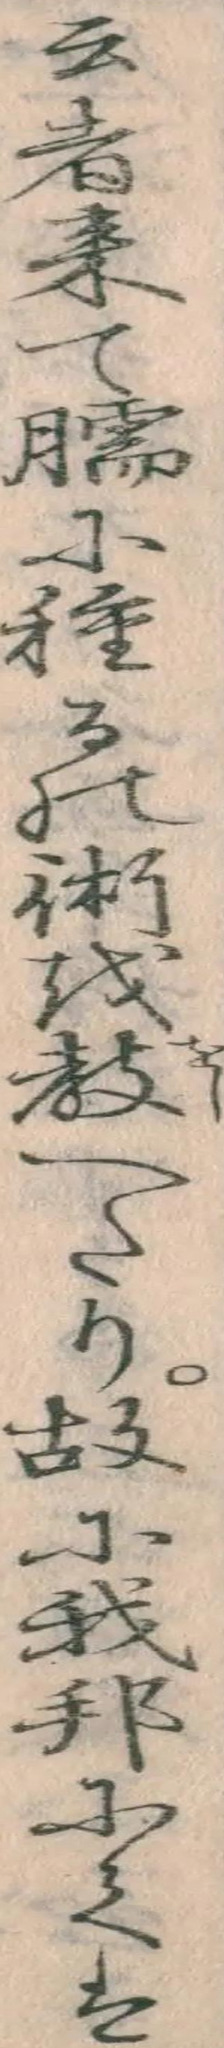云者来て臑に種るの術を教へたり。故に我邦にては
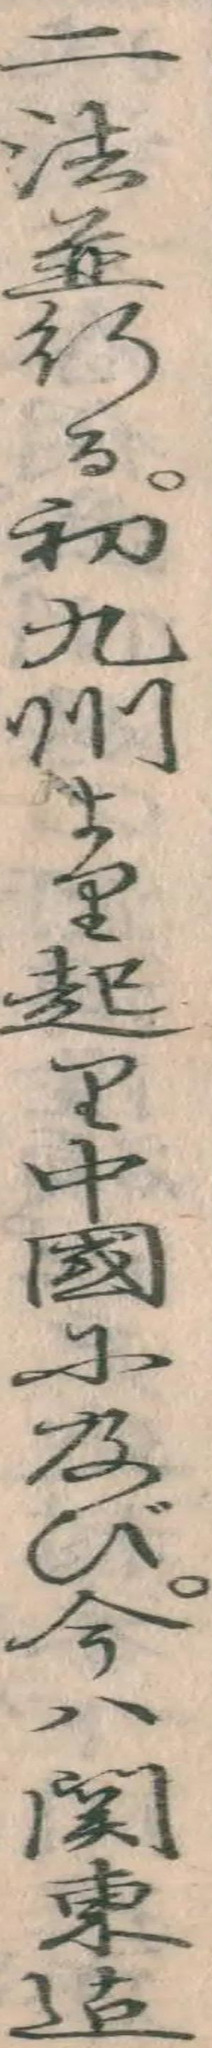二法並行る。初九州より起り中国に及び。今は関東迄
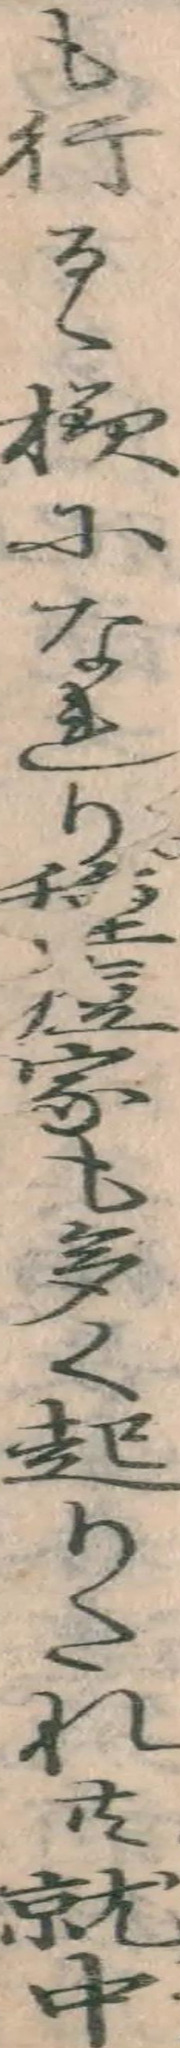も行るゝ様になれり。種痘家も多く起りたれ共。就中

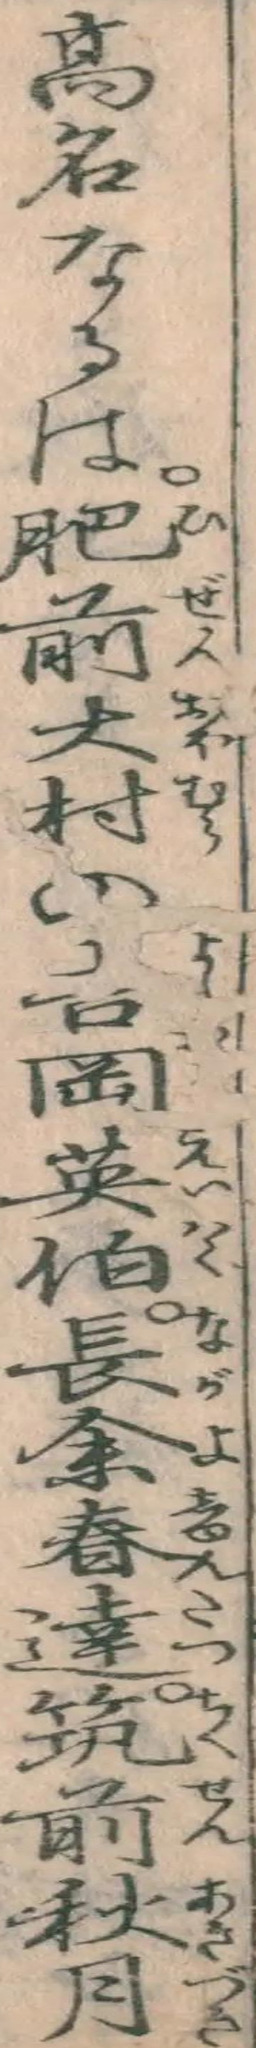高名なるは。肥前大村の吉岡英伯。長余春達。筑前秋月
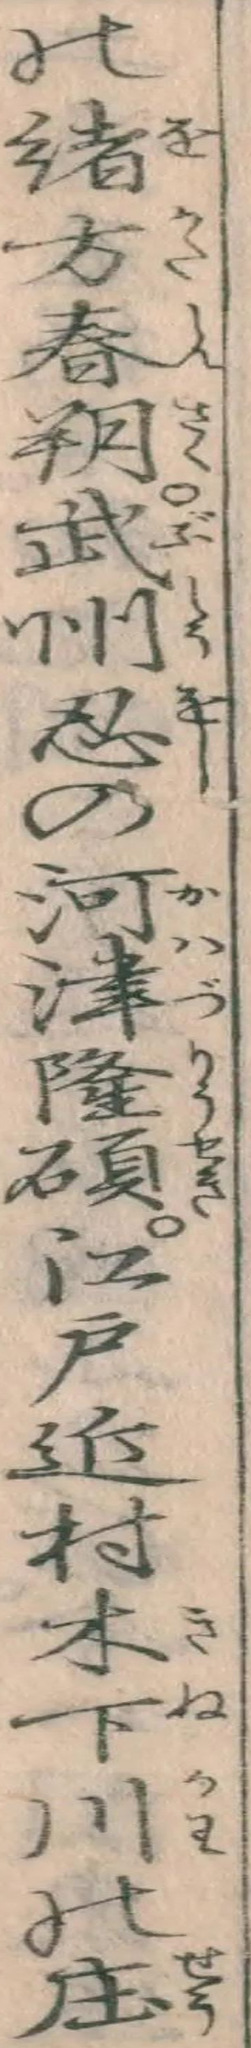の緒方春朔。武州忍の河津隆碩。江戸近村木下川の荘
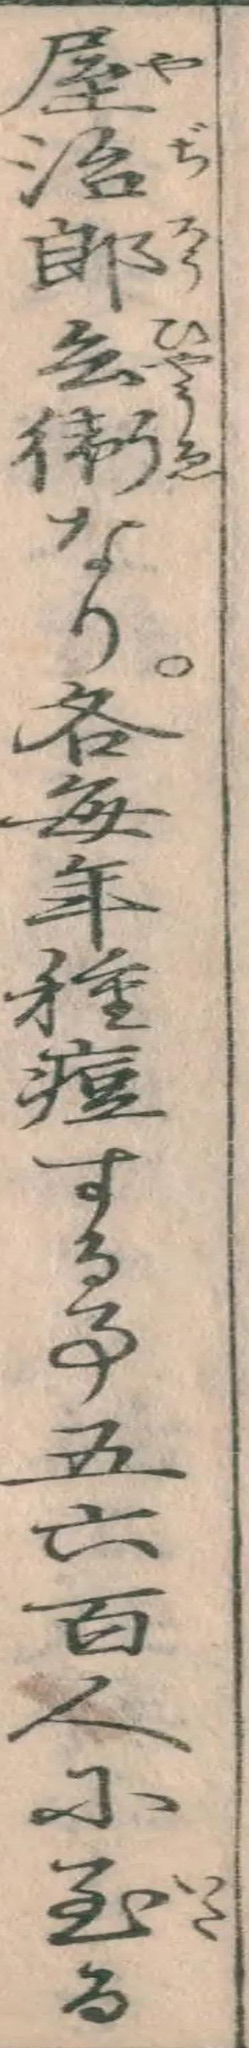屋治郎兵衛なり。各毎年種痘する事五六百人に至る
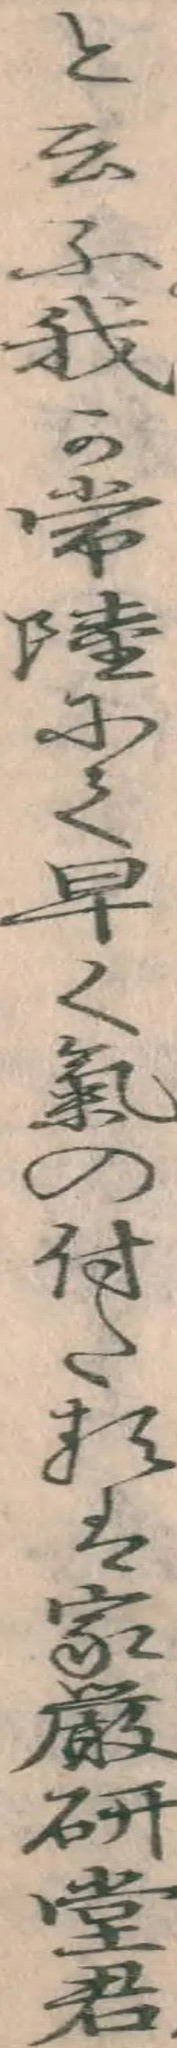と云ふ。我か常陸にて早く気の付たるは。家厳研堂君
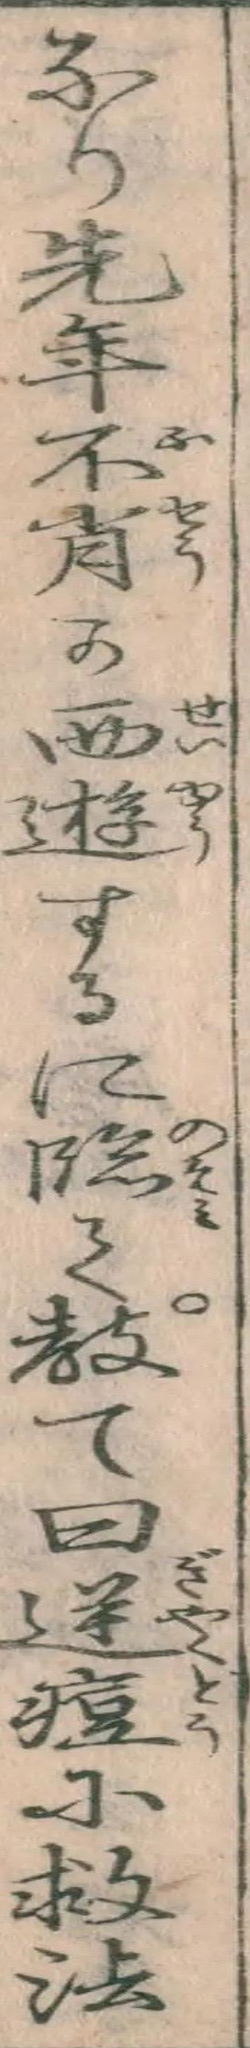なり先年不肖か西遊するに臨て。教て曰逆痘に救法
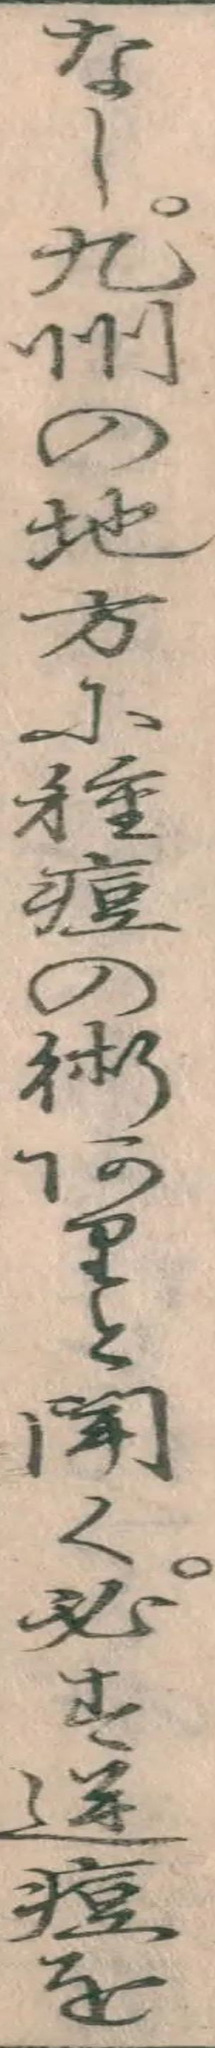なし。九州の地方に種痘の術ありと聞く。必す逆痘を
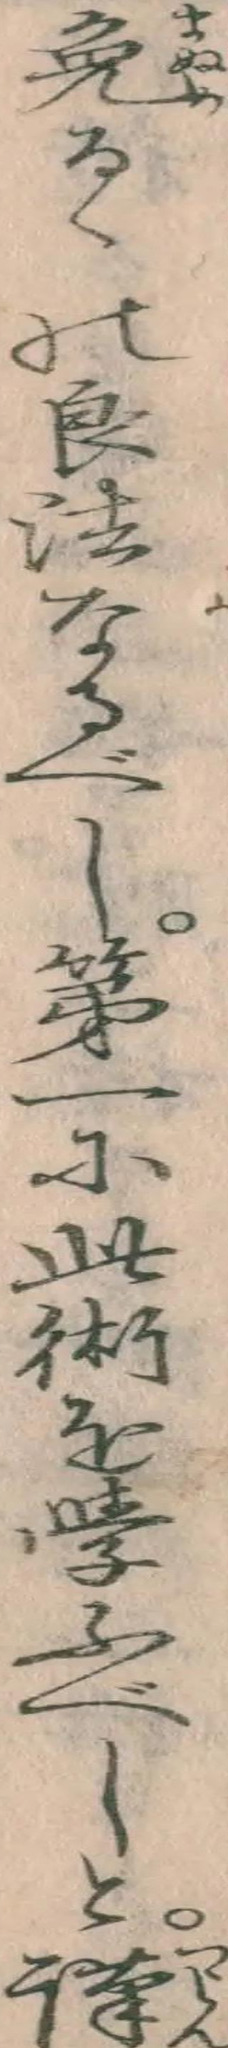免るゝの良法なるべし。第一に此術を学ふべしと。謹
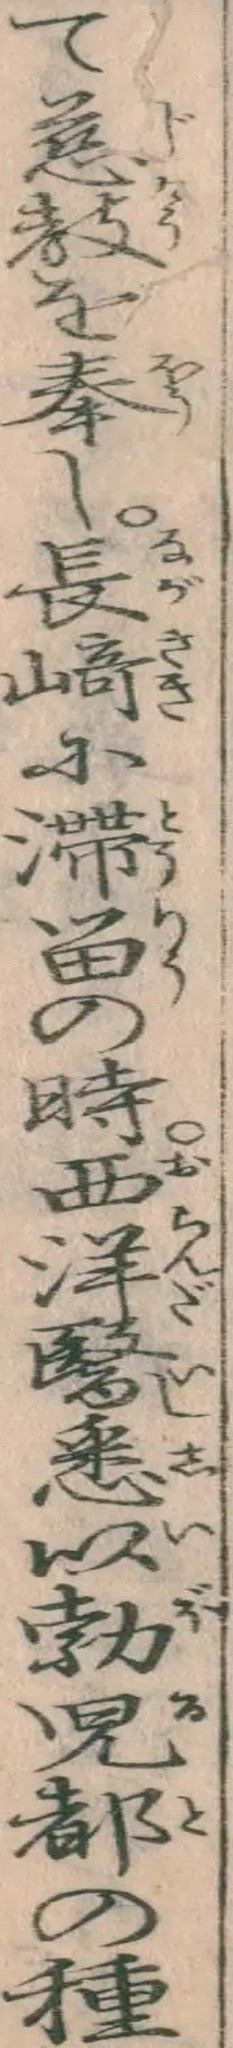て慈教を奉し。長崎に滞留の時。西洋医悉以勃児都の種
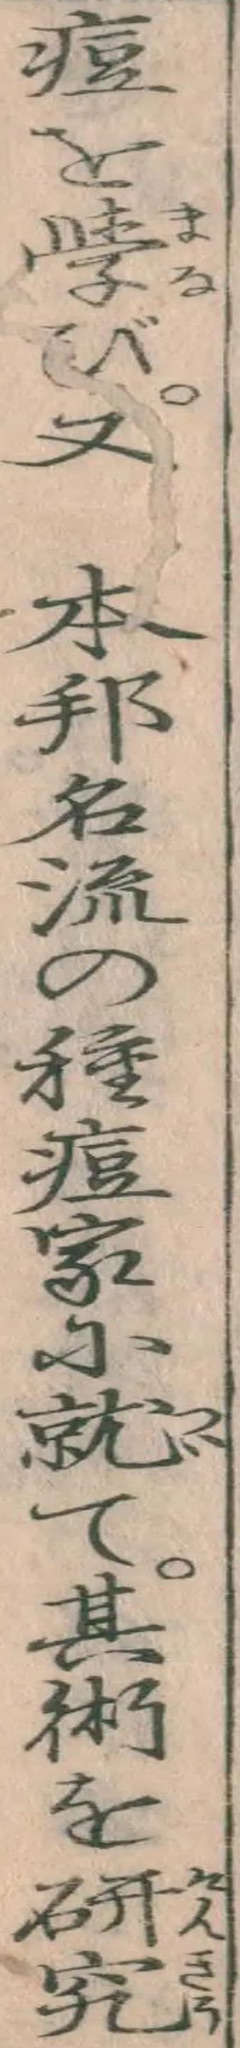痘を学び。又本邦名流の種痘家に就て。其術を研究
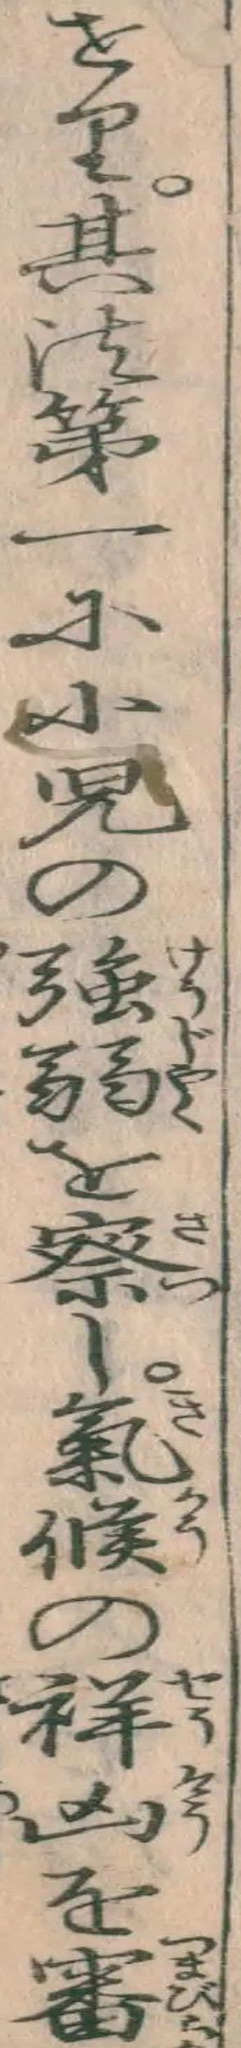せり。其法第一に小児の強弱を察し。気候の祥凶を審
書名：種痘活人十全辯
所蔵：国立国会図書館 National Diet Library, JAPAN
